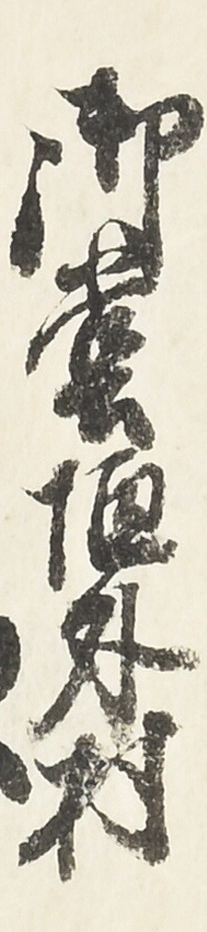御堂垣外村

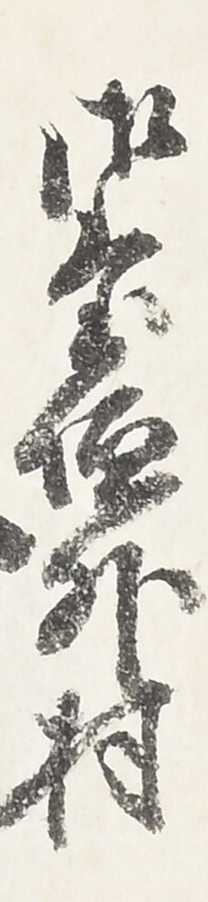御堂垣外村
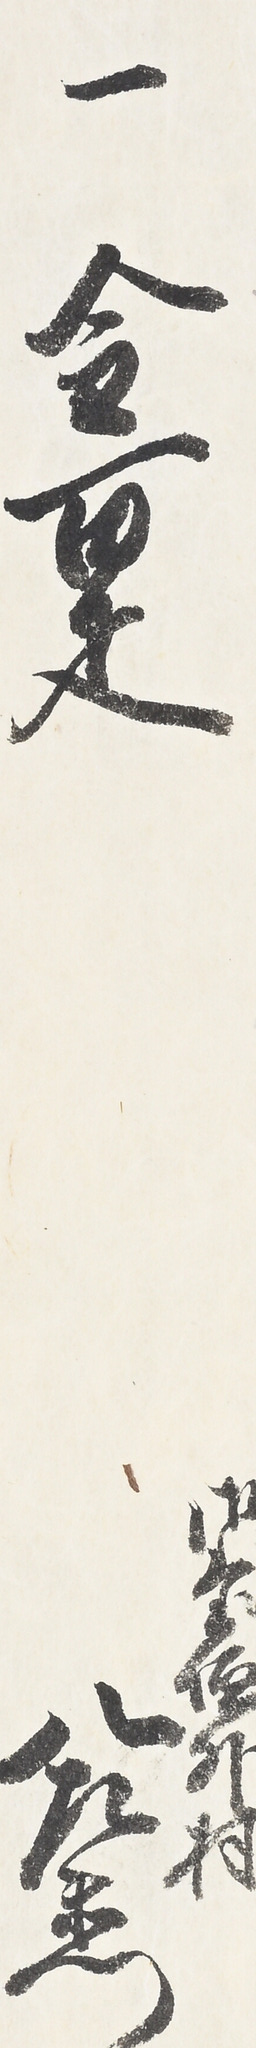一金百疋八左衛門
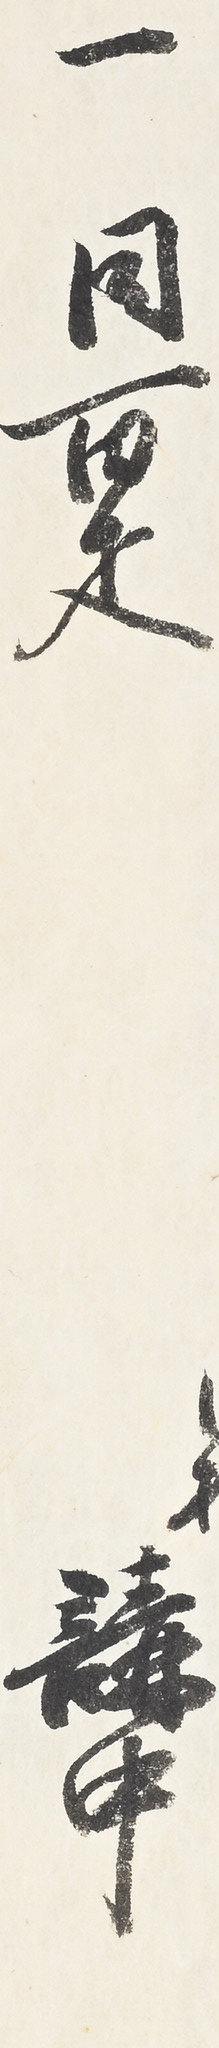一同百疋講中
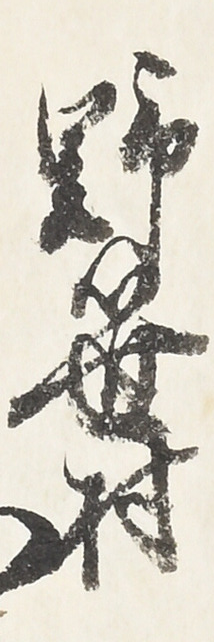野笹村
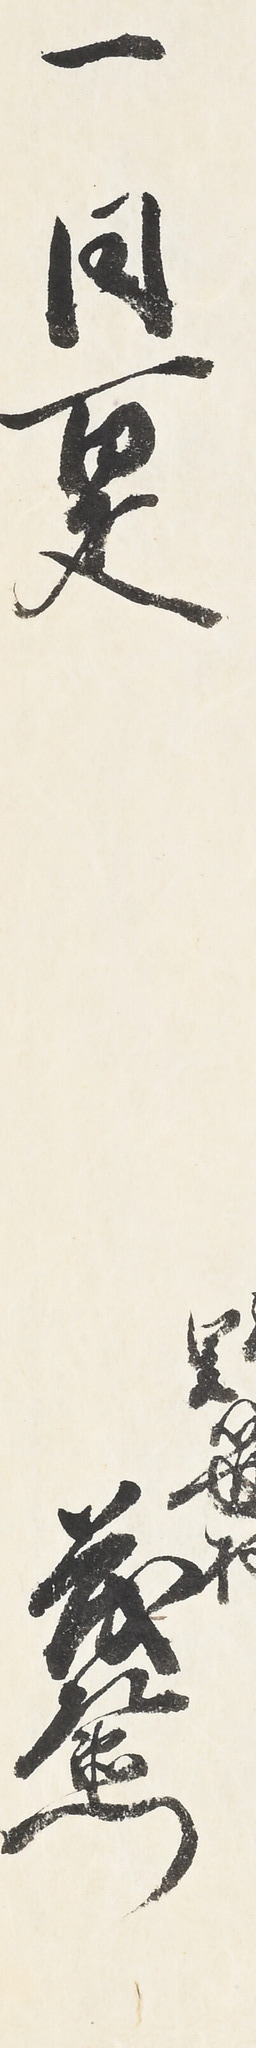一同百疋茂左衛門
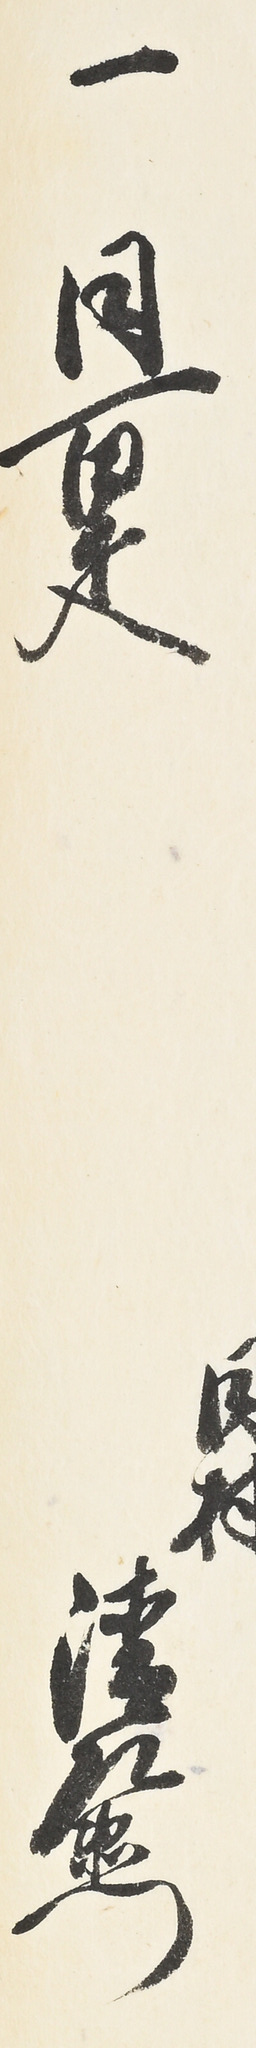一同百疋清左衛門
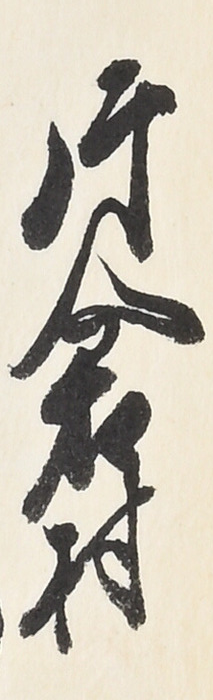片倉村
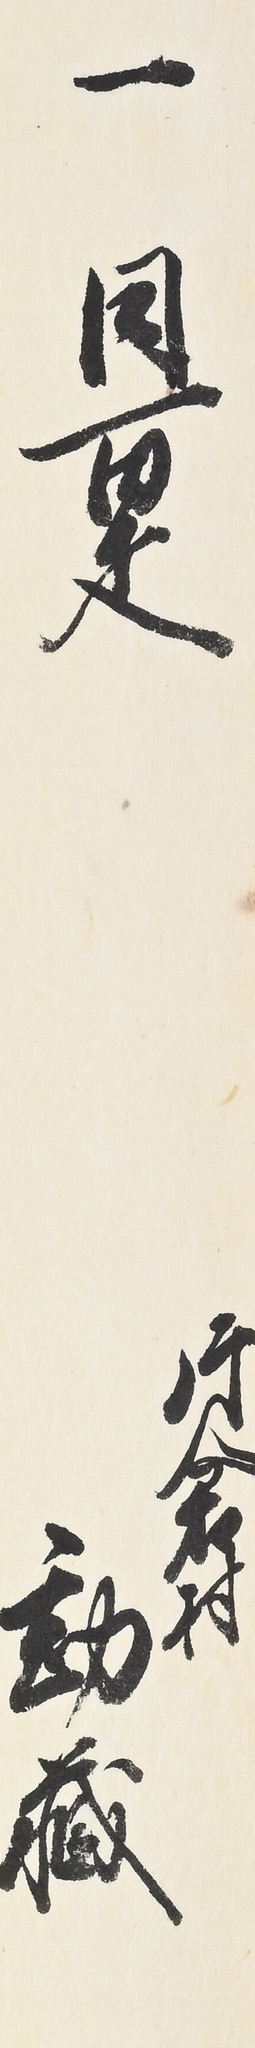一同百疋勘蔵
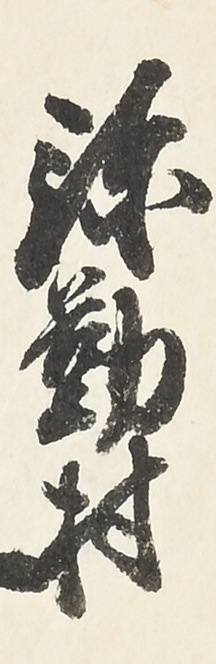弥勒村
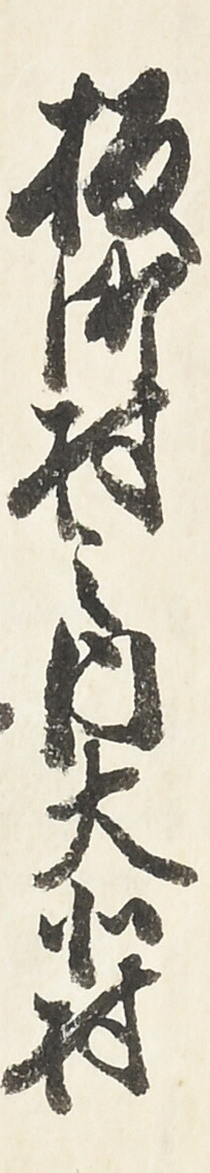板町村之内大北村

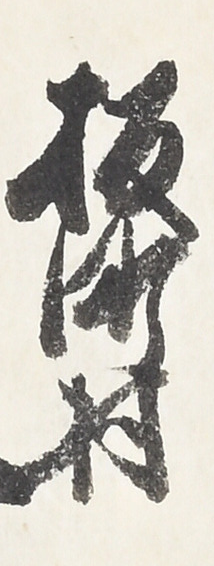板町村
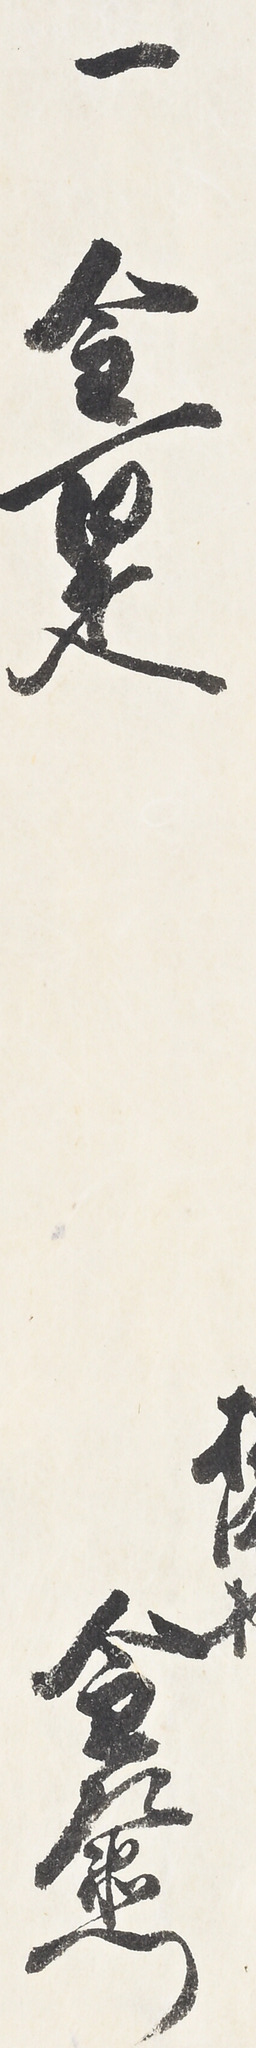一金百疋金左衛門
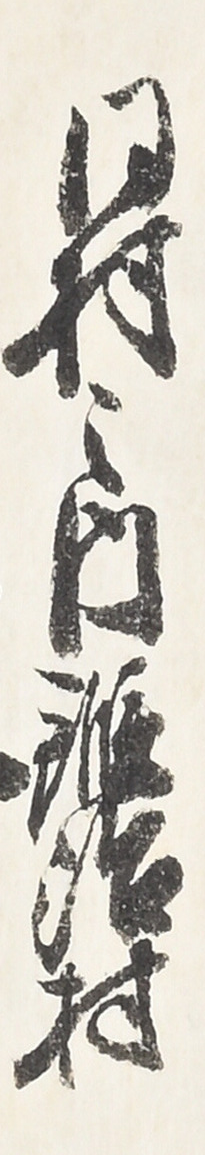同村之内鍛冶村
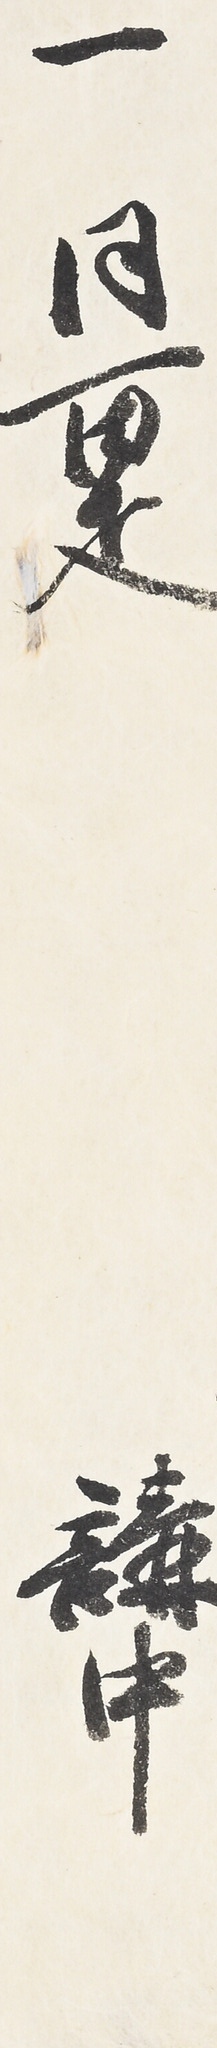一同百疋講中
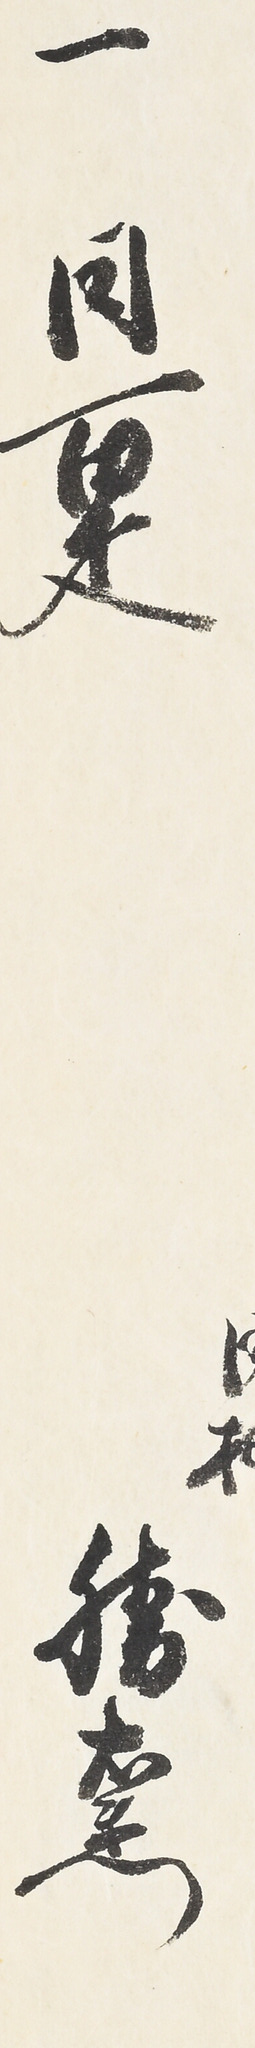一同百疋勝右衛門
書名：永代太々御神楽名前帳
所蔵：伊那市立高遠町図書館・合同会社AMANE
